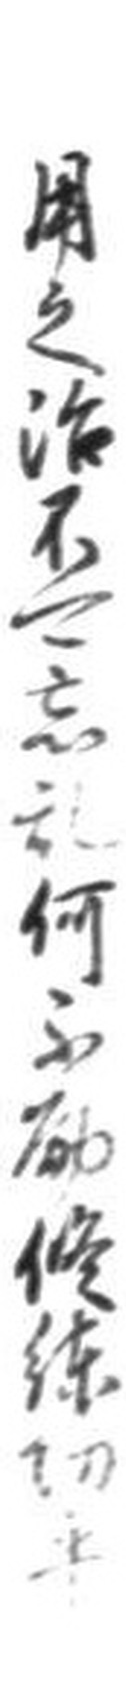用之治不可忘乱何不励修練乎

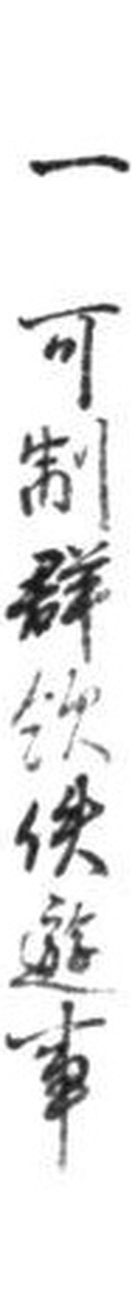一可制群飲佚遊事
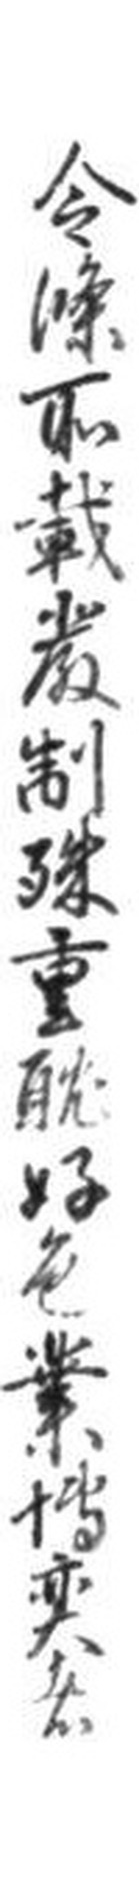令條所載厳制殊重耽好色業博奕者
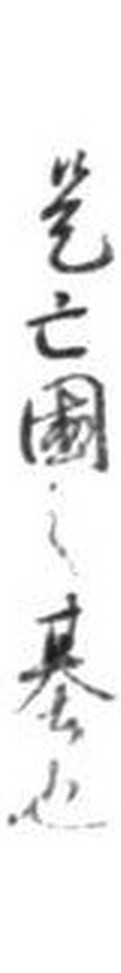是亡国之基也
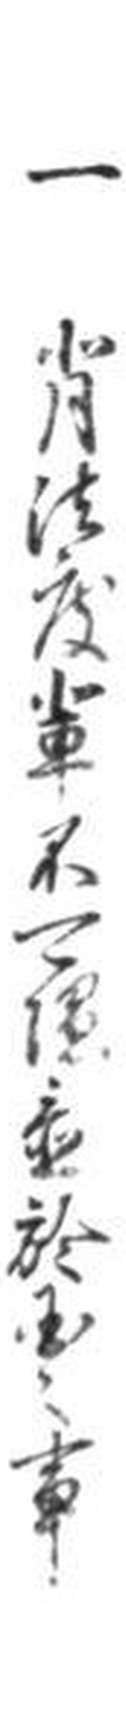一背法度輩不可隠置於国之事
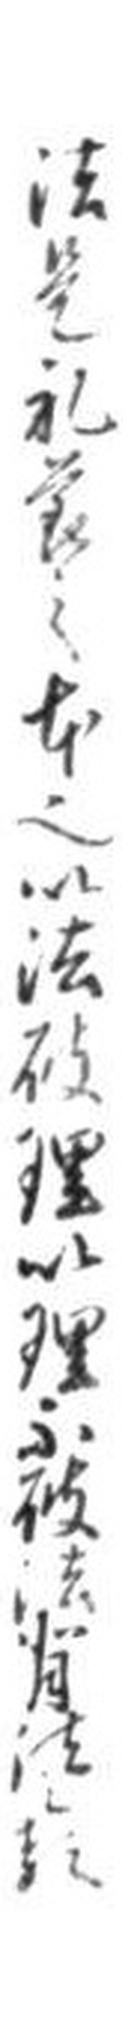法是礼節之本也以法破理以理不破法背法之類
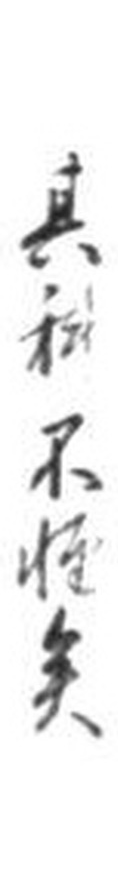其科不軽矣
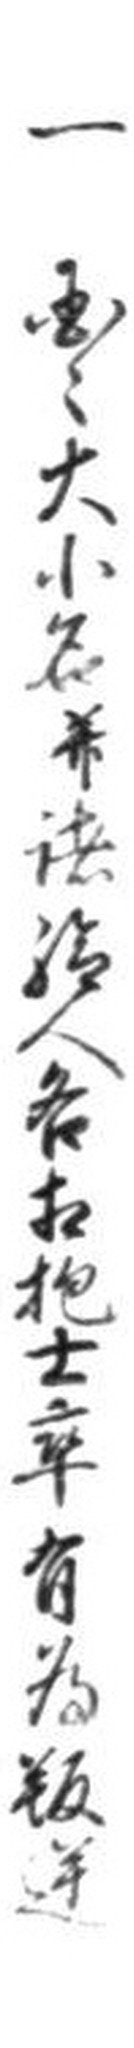一国々大小名并諸給人各相抱士卒有為叛逆
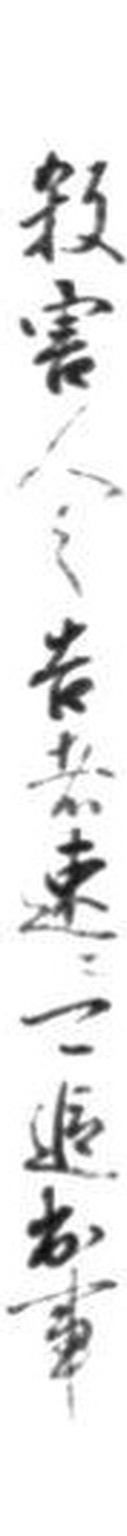殺害人之告者速ニ可追出事
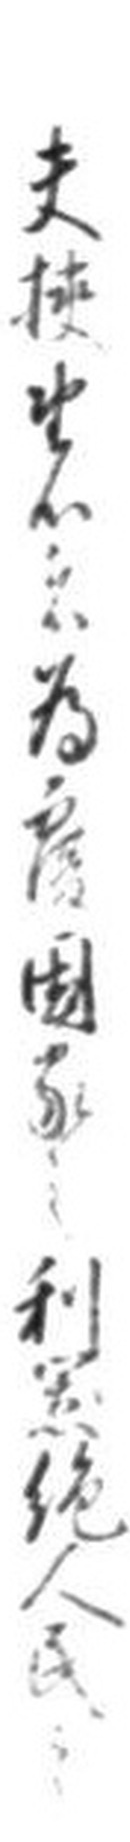夫挟野心者為覆国家之利器絶人民之
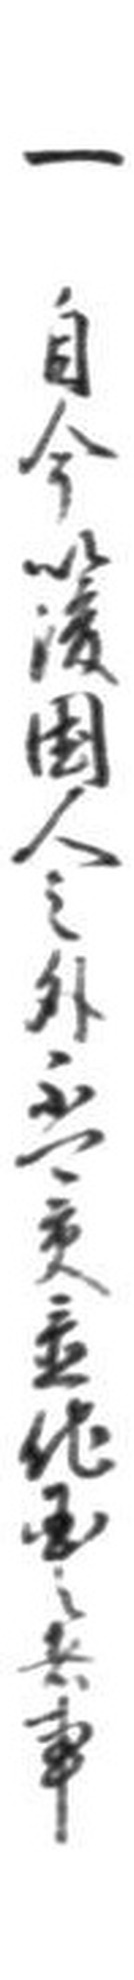一自今以後国人之外不可交置他国之者事
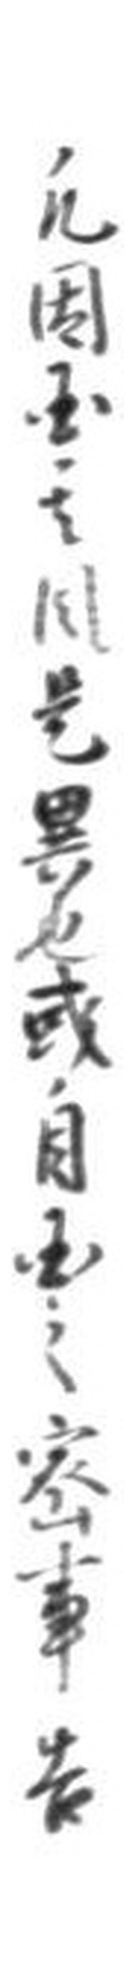凡因国其風是異也或自国之密事告
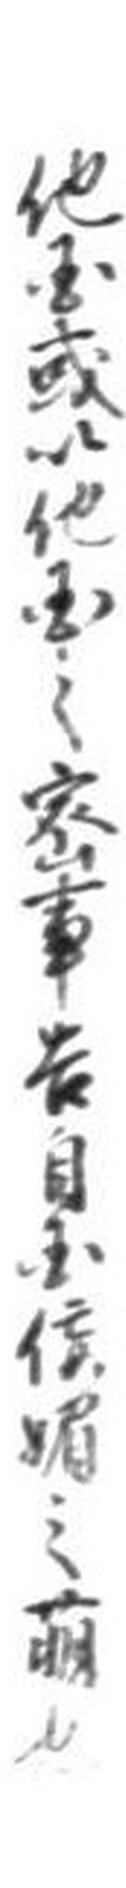他国或以他国之密事告自国侫媚之萌也
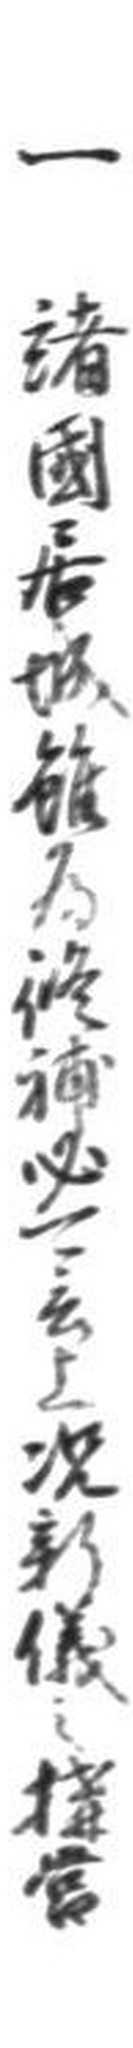一諸国居城雖為修補必可言上況新儀之構営
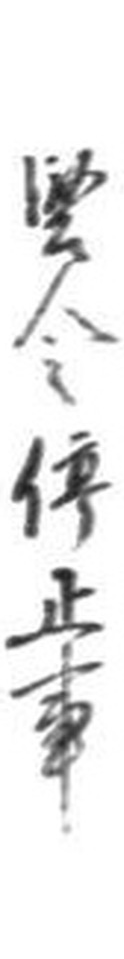堅令停止事
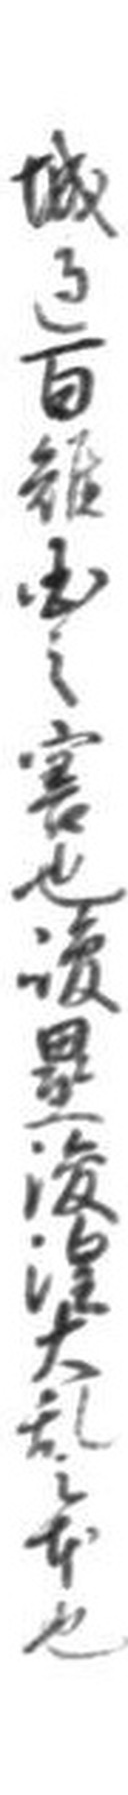城過百雉国之害也塁浚湟大乱之本也
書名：家譜 二 忠直公 従文禄四年到慶安四年
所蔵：福井県文書館 Fukui Prefectural Archives
